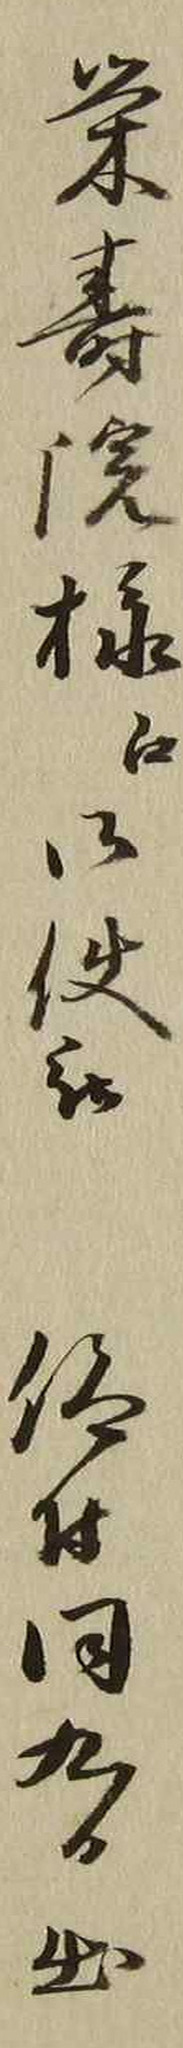栄寿院様江御使被仰付同九日出
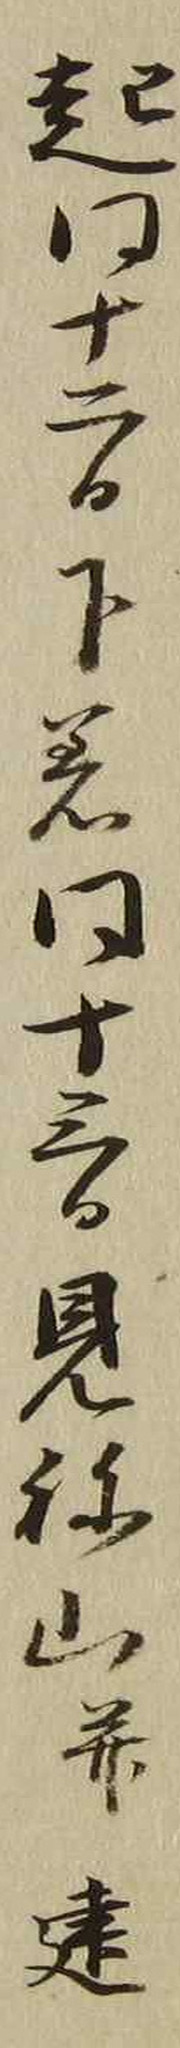起同十二日下着同十三日見祢山幷建
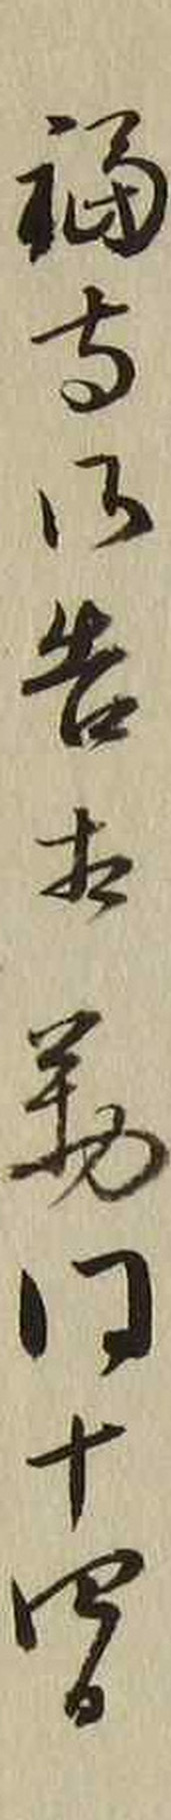福寺御告相勤同十四日
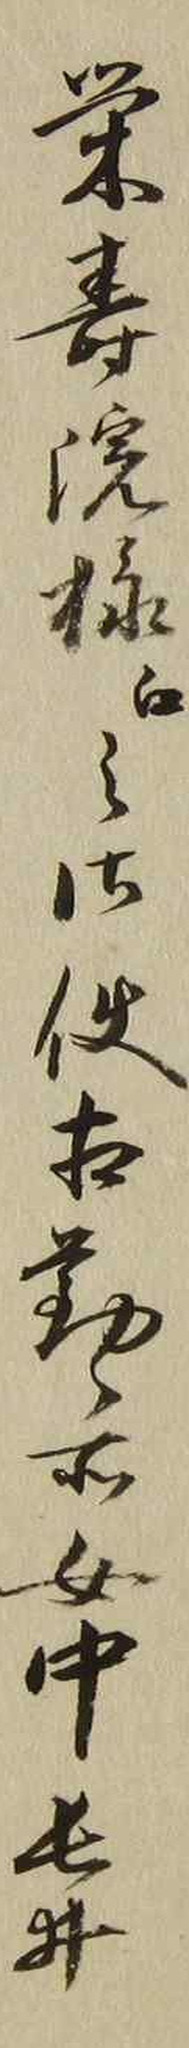栄寿院様江之御使相勤候所女中長井
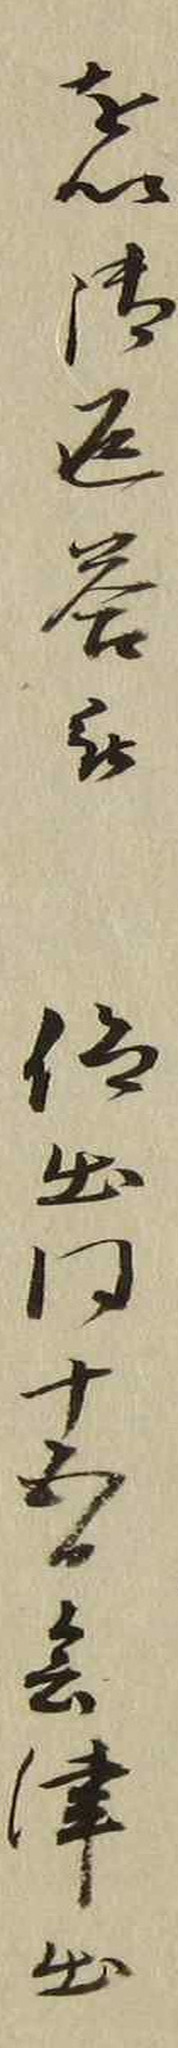を以御返答被仰出同十五日会津出
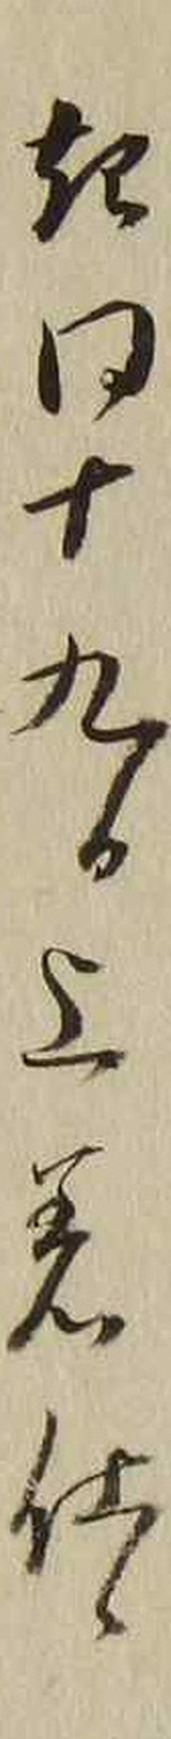起同十九日上着仕候
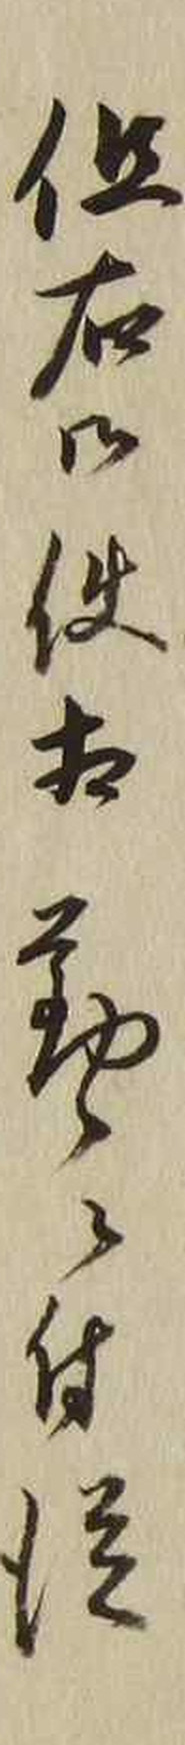但右御使相勤候ニ付従
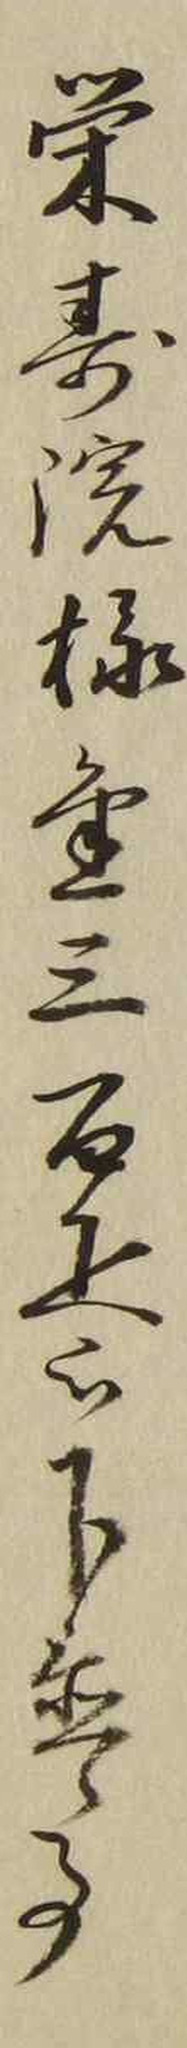栄寿院様金三百疋被下置候事

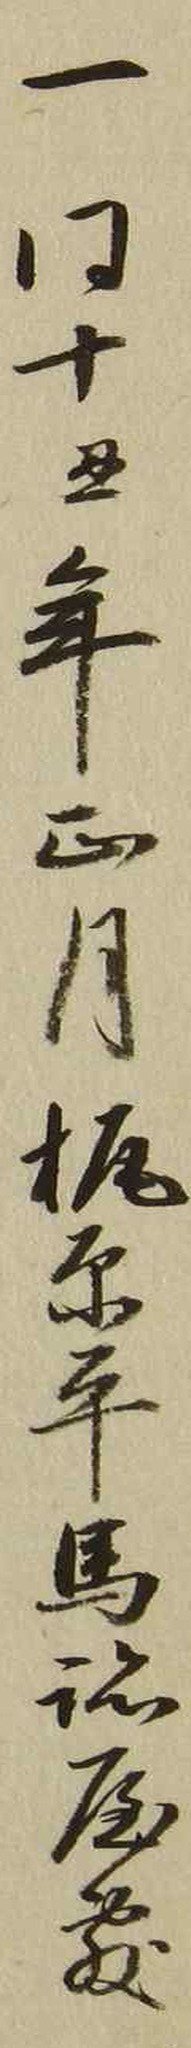一同十丑年正月梶原平馬跡屋敷
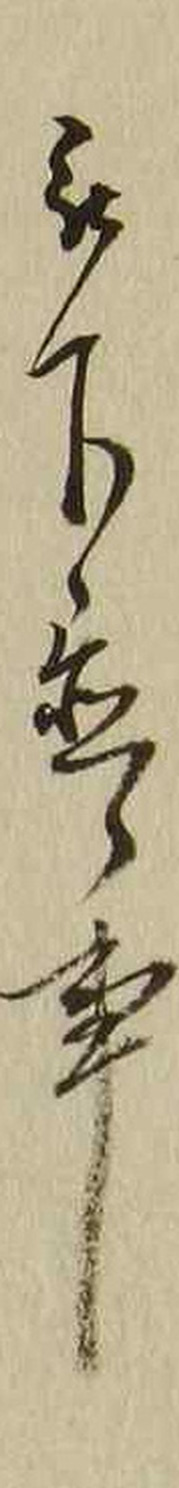被下置候事
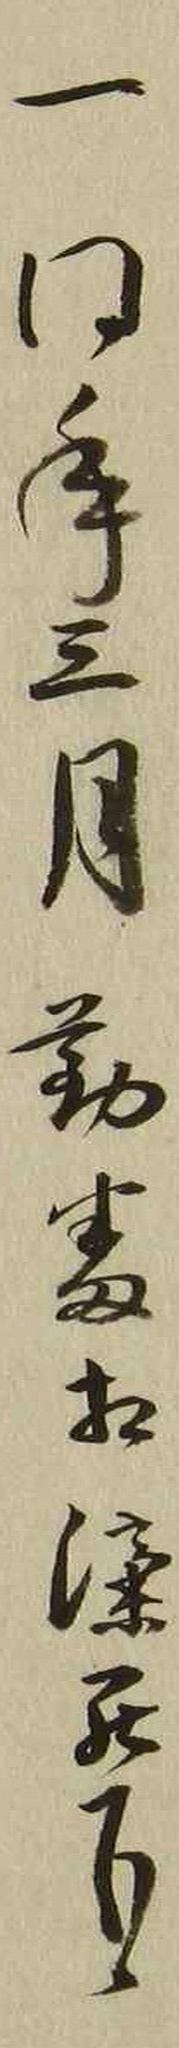一同年三月勤番相済罷下候
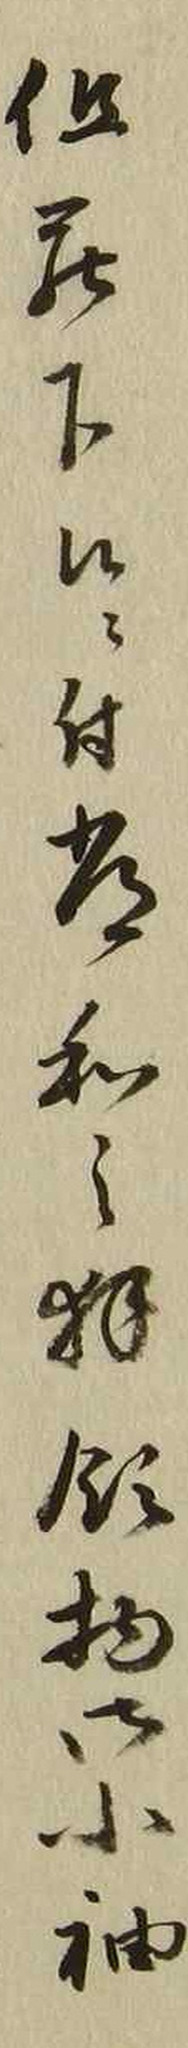但罷下候ニ付常和之拝領物御小袖
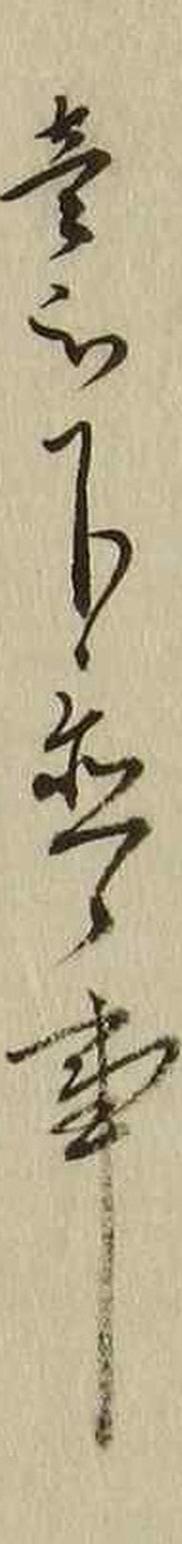被下置候事
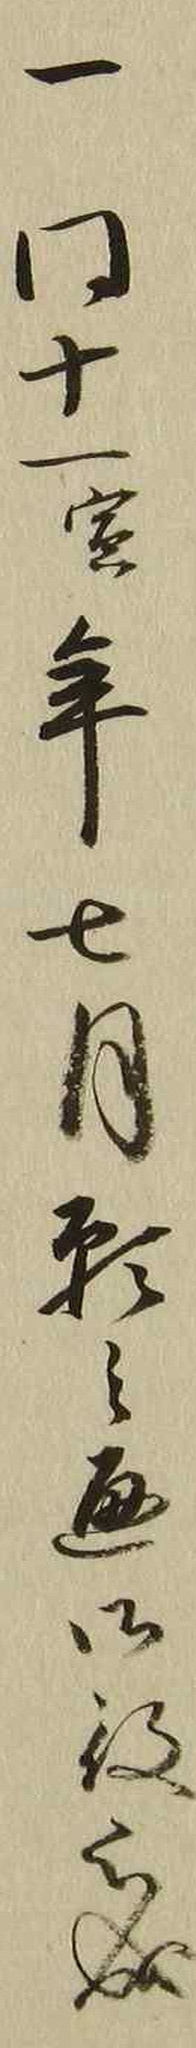一同十一寅年七月願之通御役被成
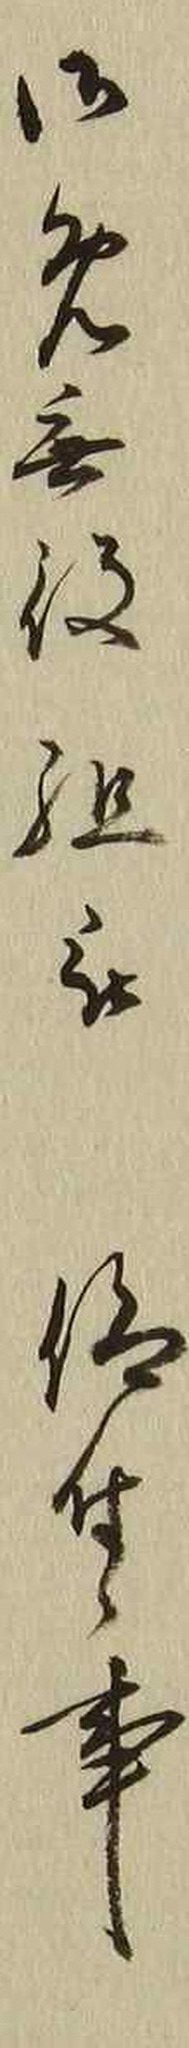御免無役組被仰付候事
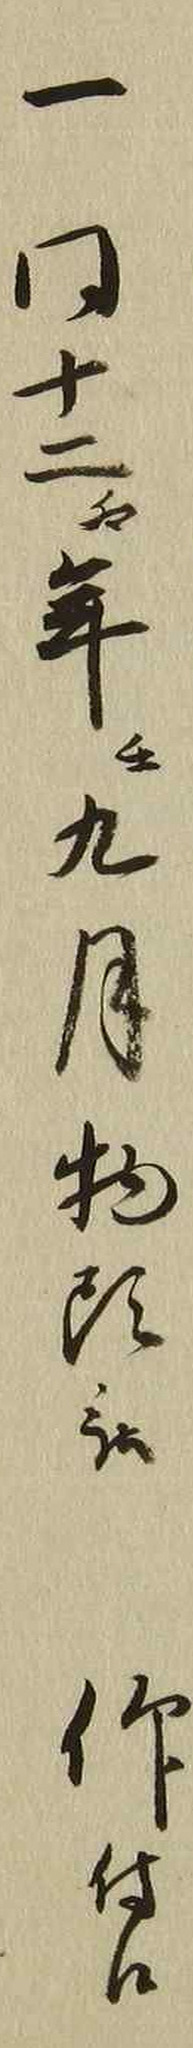一同十二卯年閏九月物頭被仰付候
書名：諸士系譜　巻之69　を之部3
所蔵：会津若松市立会津図書館
